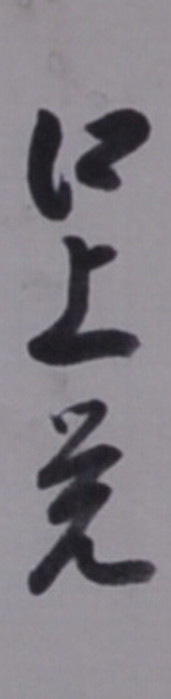口上覚
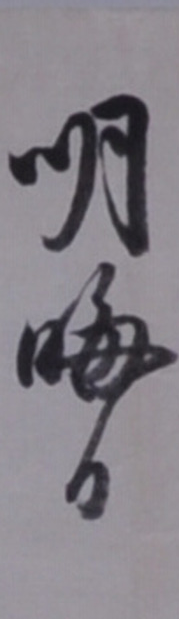明晦日
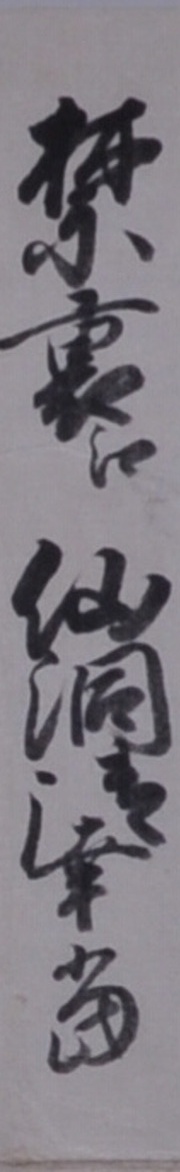禁裏江仙洞御幸当
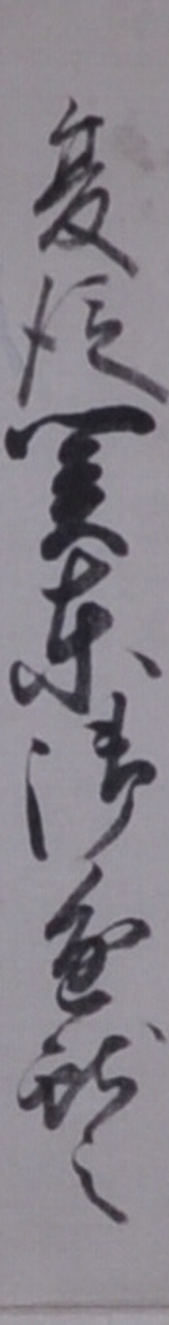夏従関東御進献之
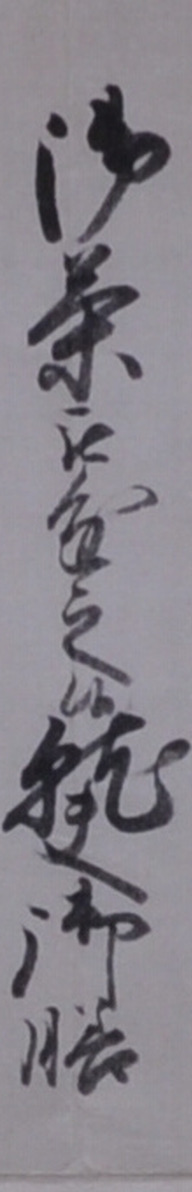御茶被進之候就夫御膳
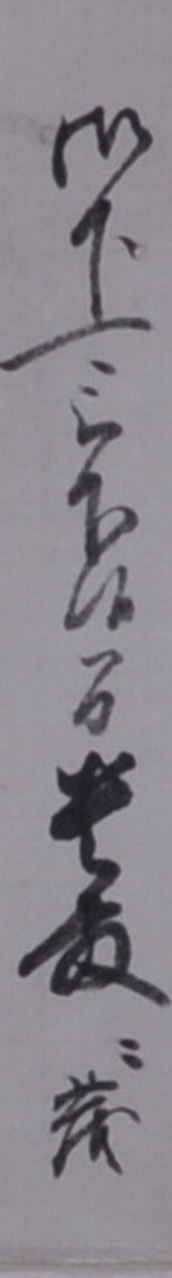御下可被下候間貴殿二も
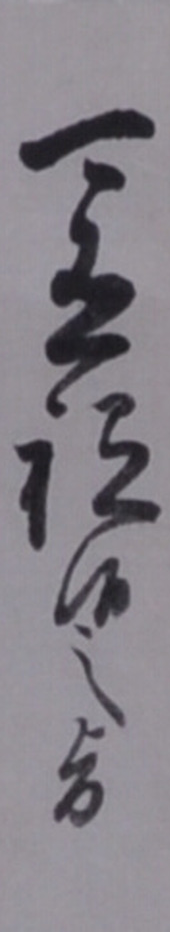可有程候之旨
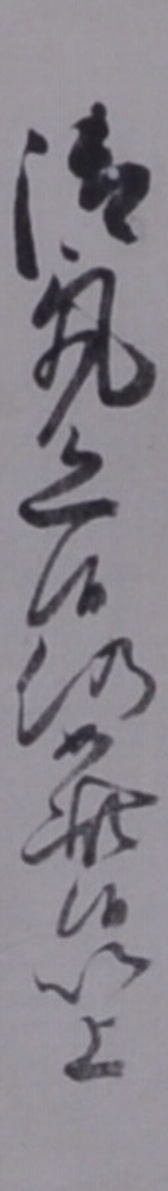御取上候仍如此候以上
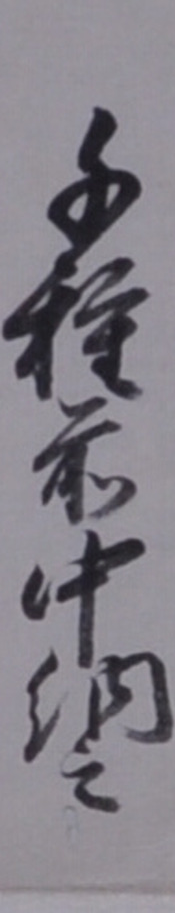千種前中納言
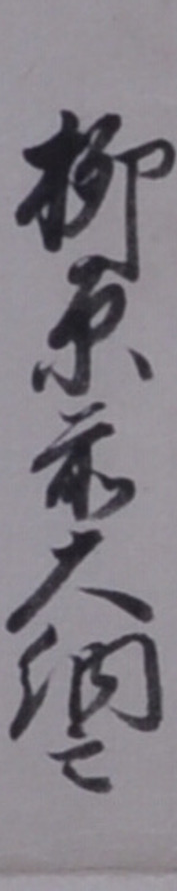柳原前大納言
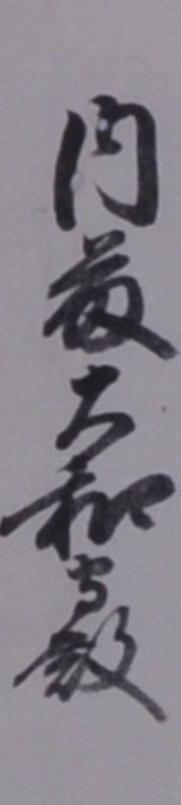内藤大和守殿
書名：口上覚
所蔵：伊那市立高遠町図書館・合同会社AMANE
